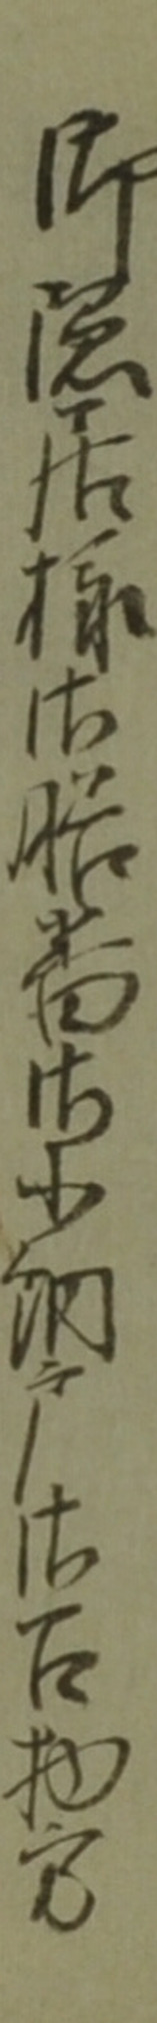御隠居様御膳番御小納戸御召物方
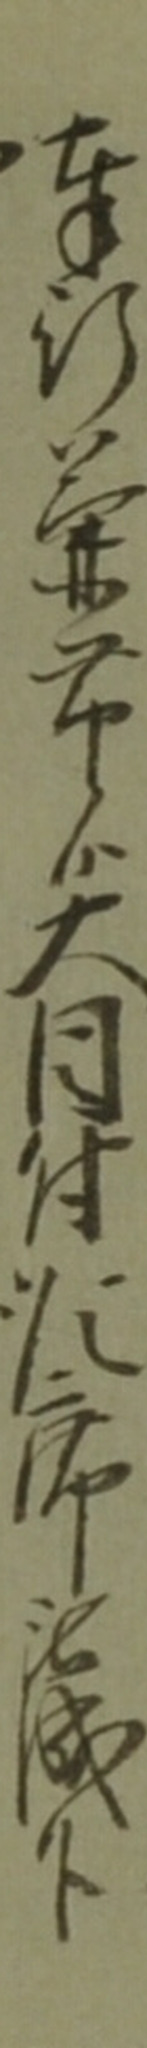奉行兼帯候大目付順席被成下
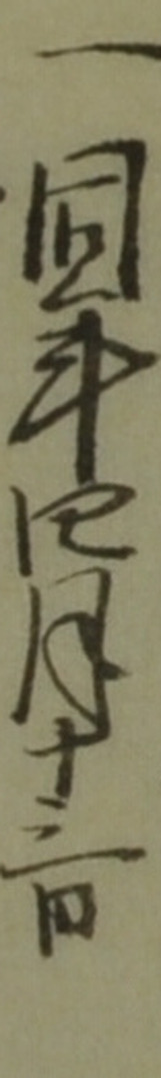一同年四月十三日
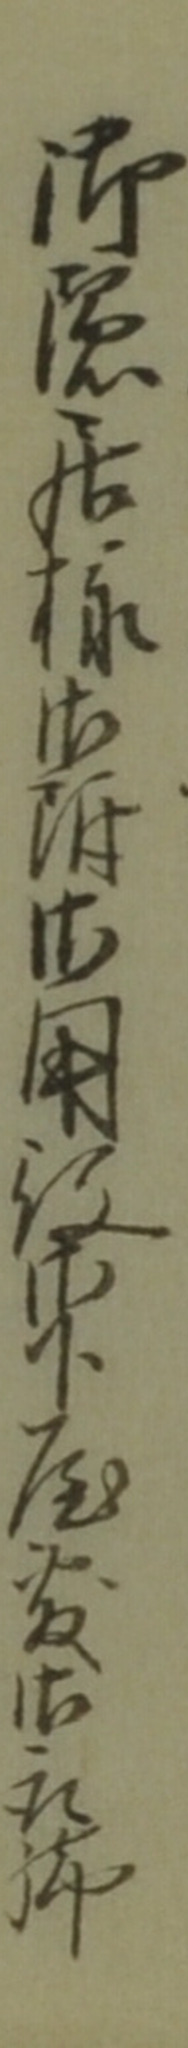御隠居様御附御用役御下屋敷御取躰
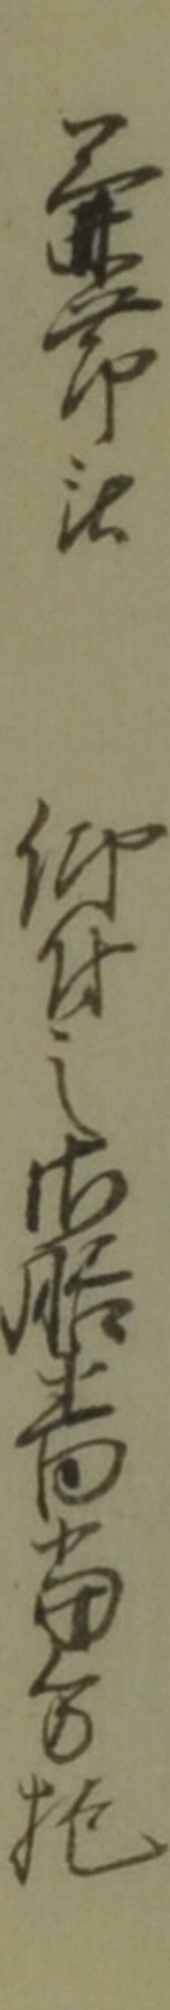兼帯被仰付之御膳番当方抱
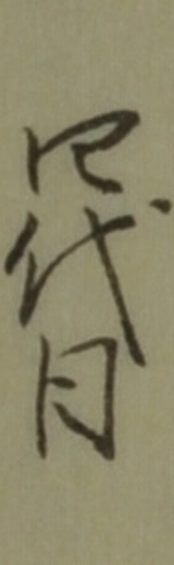四代目
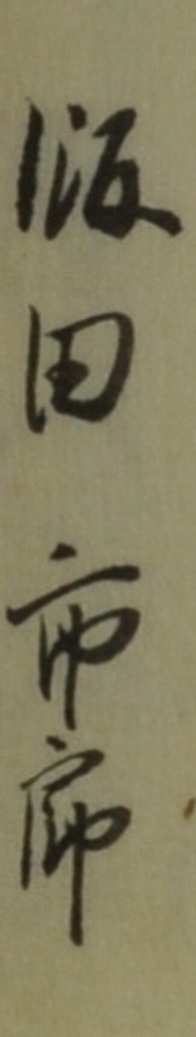飯田市郎
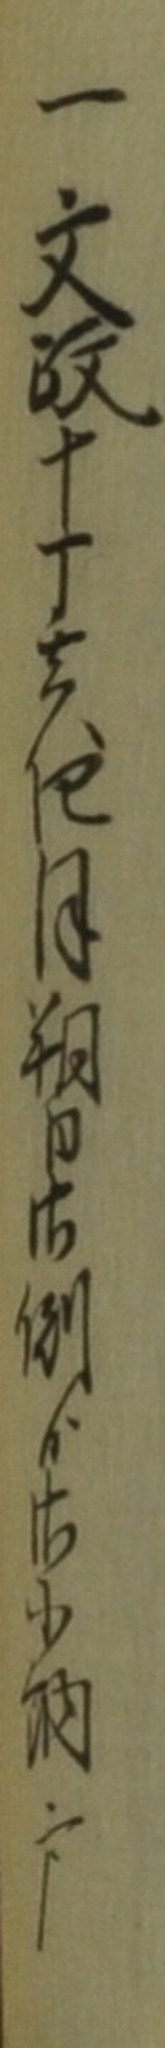一文政十丁亥四月朔日御側ゟ御小納戸
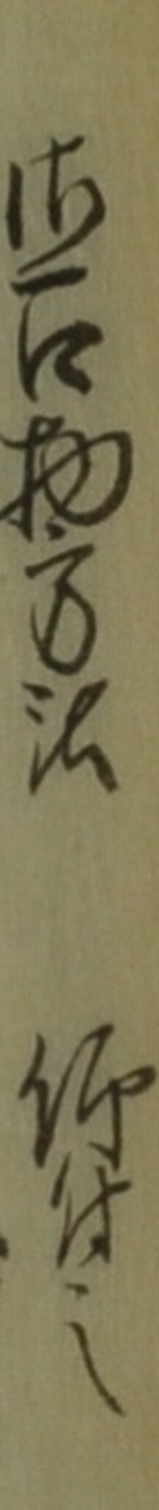御召物方被仰付之
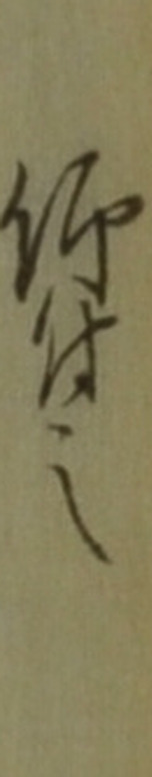仰付之
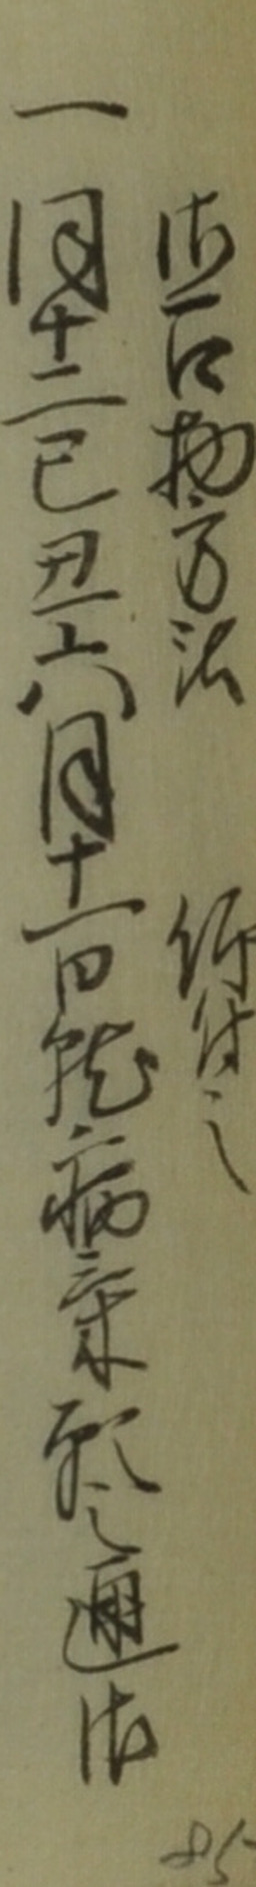一同十二己丑六月十一日就病気願之通御
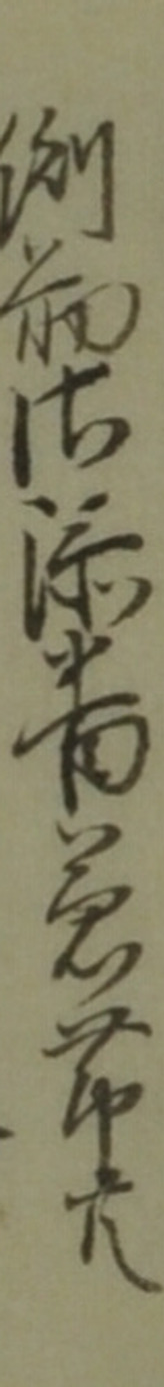側勤御添番兼帯共
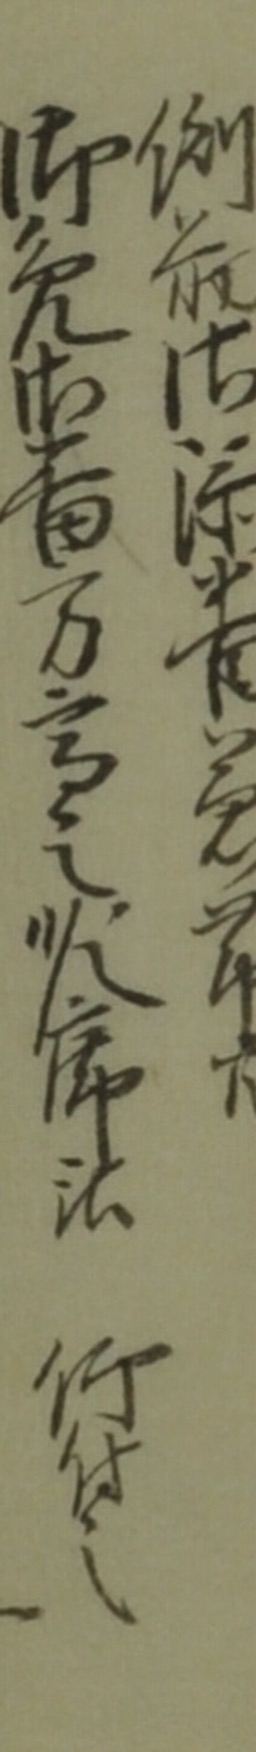御免御番方高之順席被仰付之
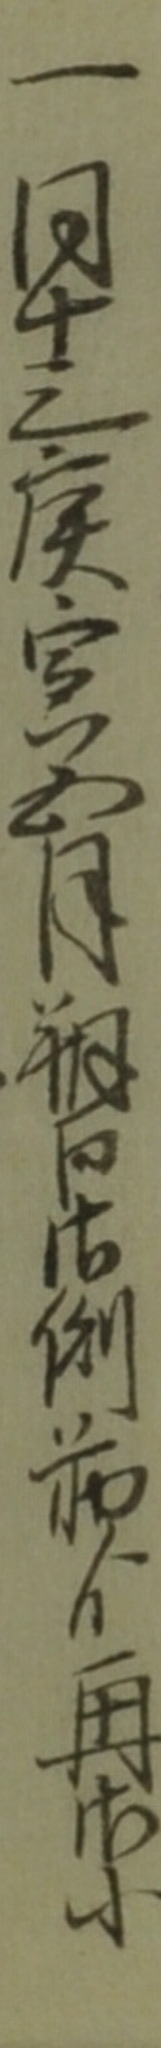一同十三庚寅五月朔日御側勤ゟ再御小
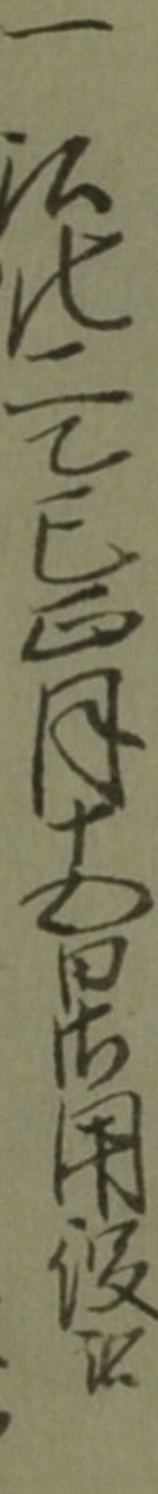一弘化二乙巳正月十五日御用役被
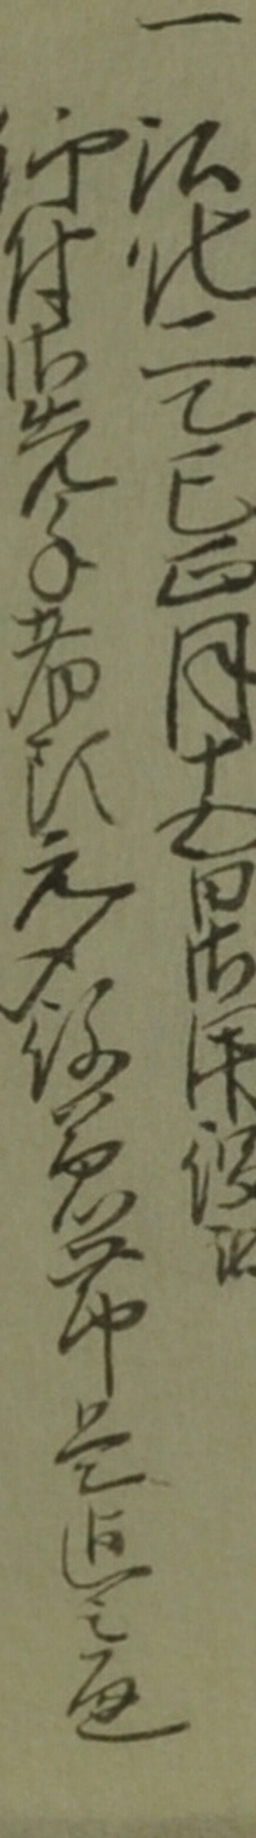仰付御先手者頭元〆役兼帯是迄之通
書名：諸御役代々録（四）
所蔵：伊那市立高遠町図書館・合同会社AMANE
